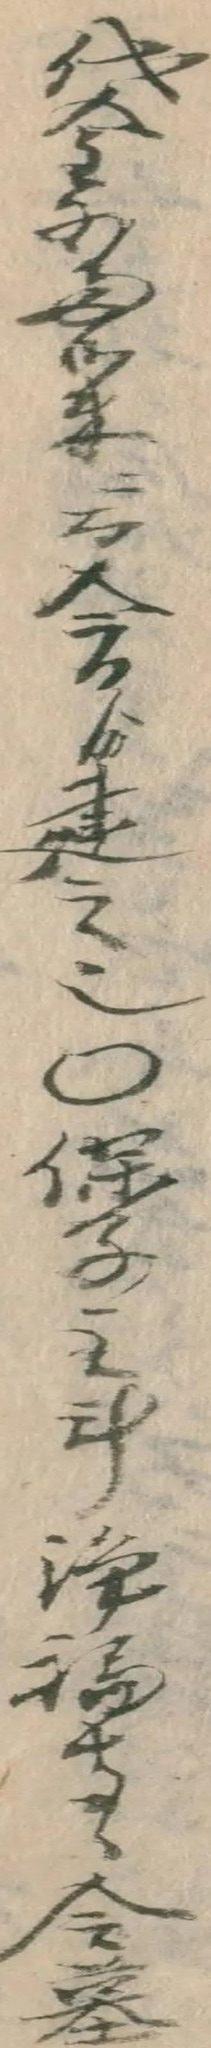代金千両弐朱ニ而今日ゟ建之也〇保子之斗浄福寺へ令墓
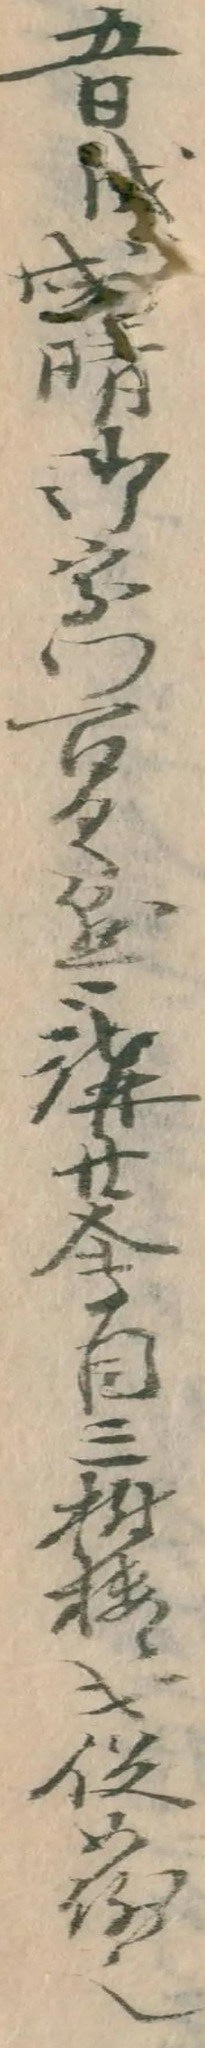五日戊戌刻御家門百匁懸御講廿會目三樹楼ニ成役如例也

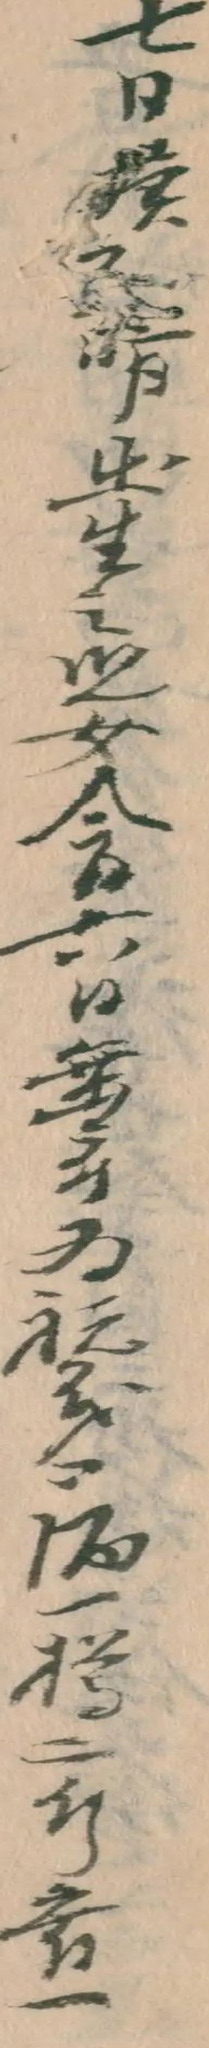七日庚子晴出生之児女今日六日歯ニ付為祝義御酒一樽二升肴一
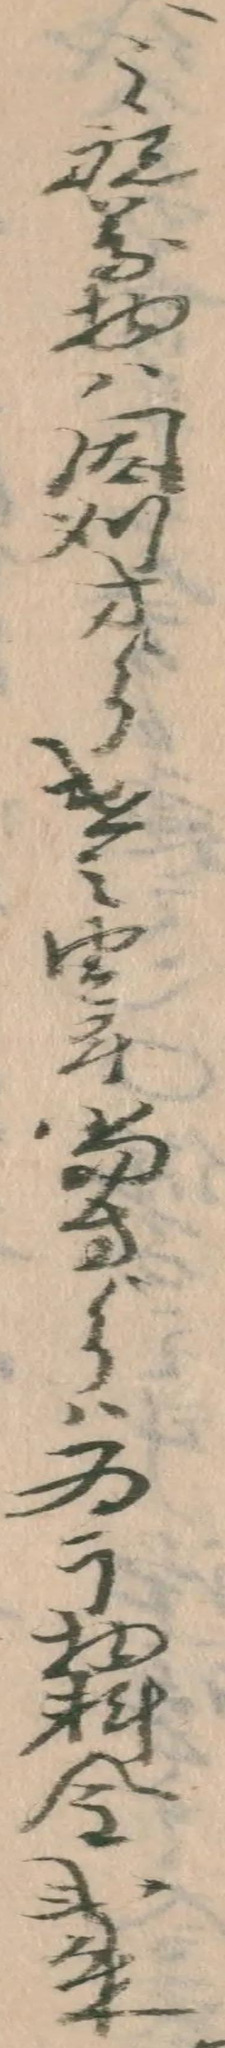ヘ之祝儀物は因州方より遣之由ニ付當方よりハ為干物料金弐朱
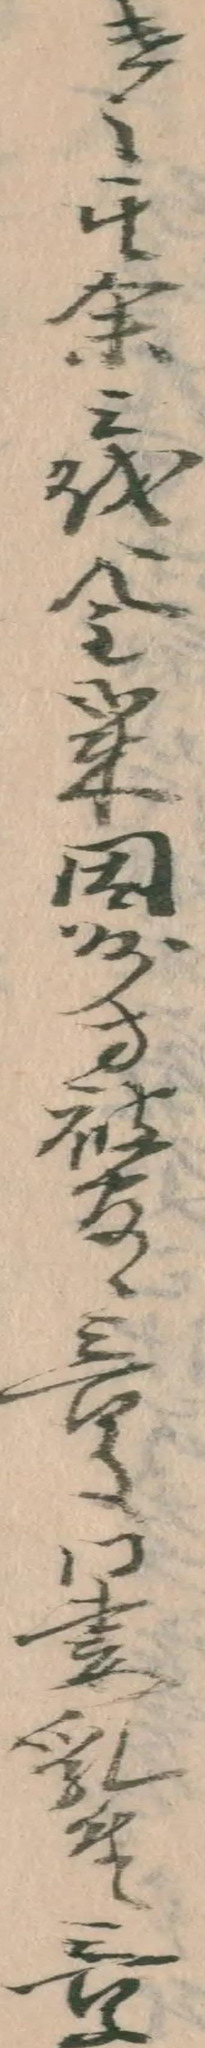遣之其余之残ヘ金弐朱因州方被官候三百文同妻乳付ヘ三百文
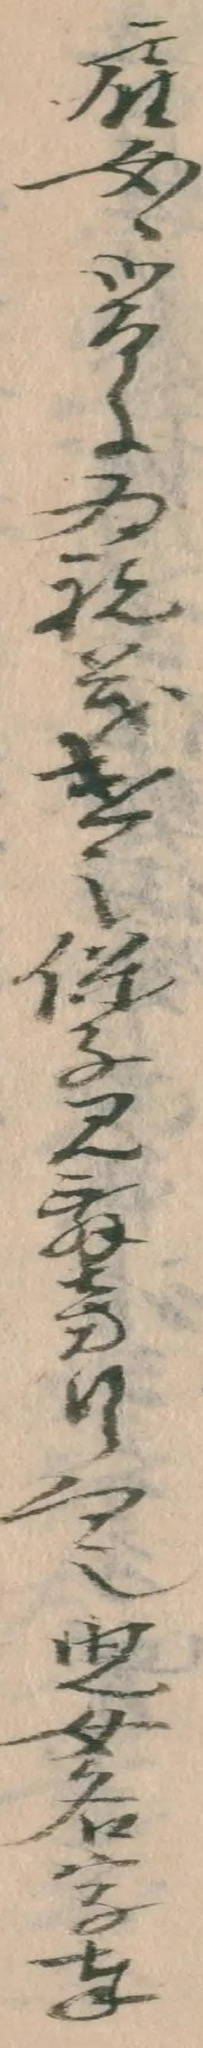雇女へ弐百文為祝義遣之保子見舞旁引向之児女名字達
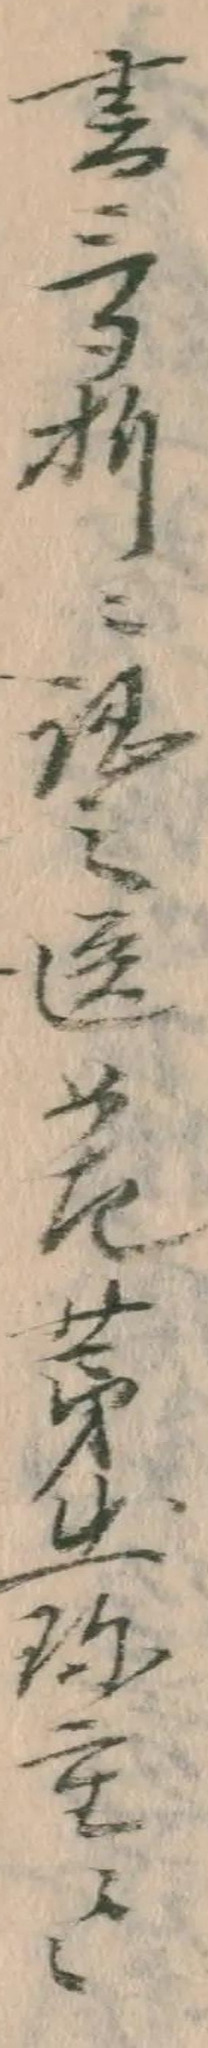書三ヶ折に認之送如左茅出珍重々々
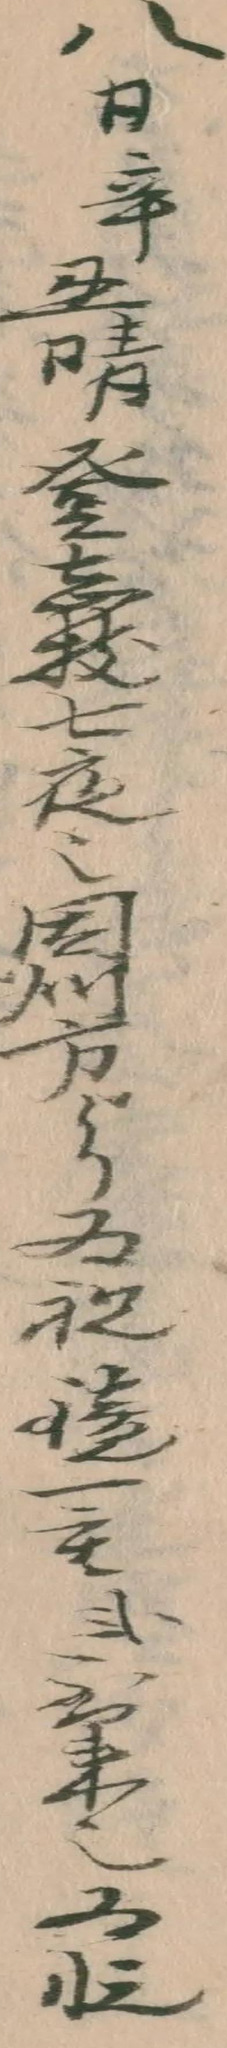八日辛丑晴登志枝七夜也因州方より為祝鏡一重弐到来也為悦
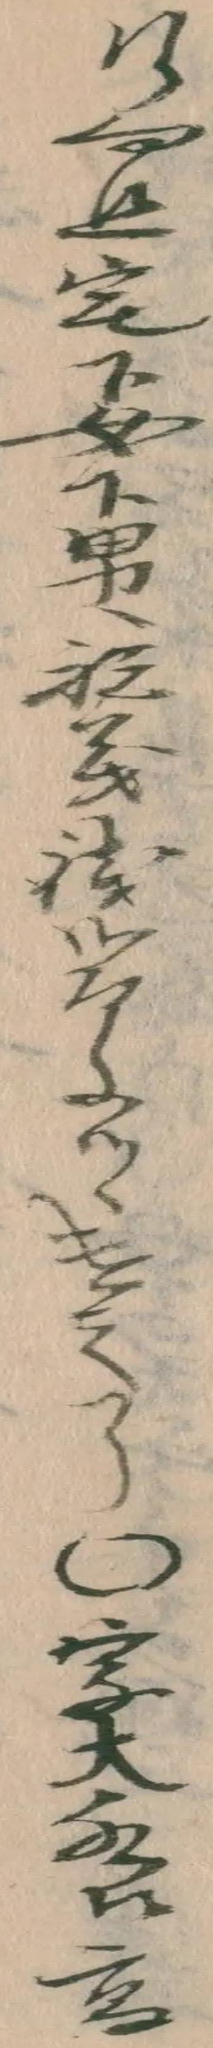行向且宅下女下男へ祝義銭弐百文ツヽ遣之了○字大水口高
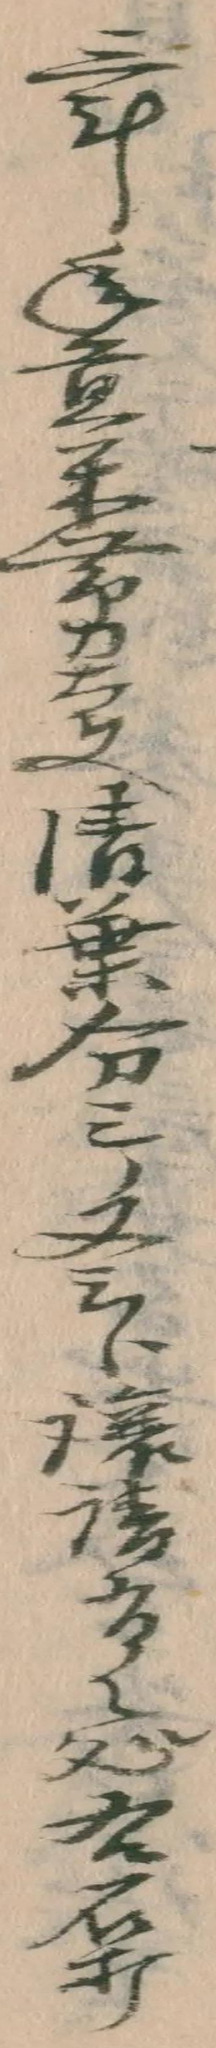三斗年貢米帯刀大夫清葉分三ノ又三郎譲請有之処右石打
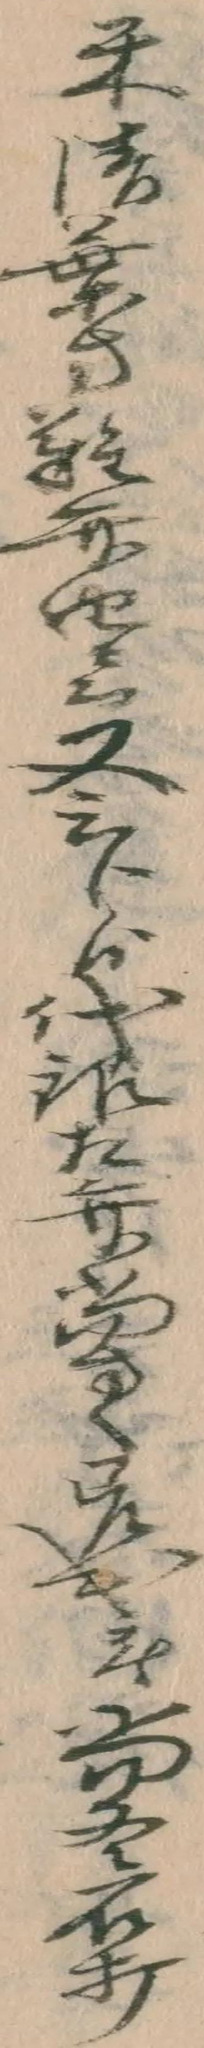米清葉方難弁由ニ而又三郎ゟ代銀相弁當方へ差出ニ付當冬石打
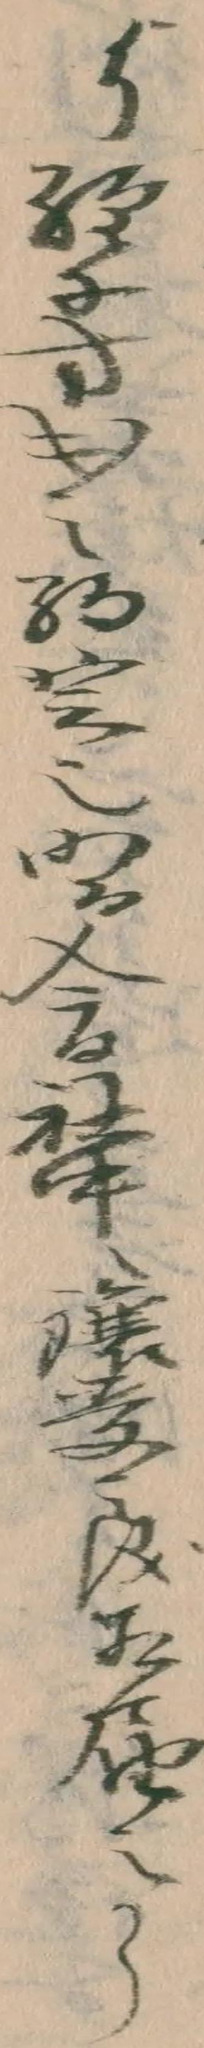より経千方出之約定也仍而今日社中へ譲受之儀相届之了
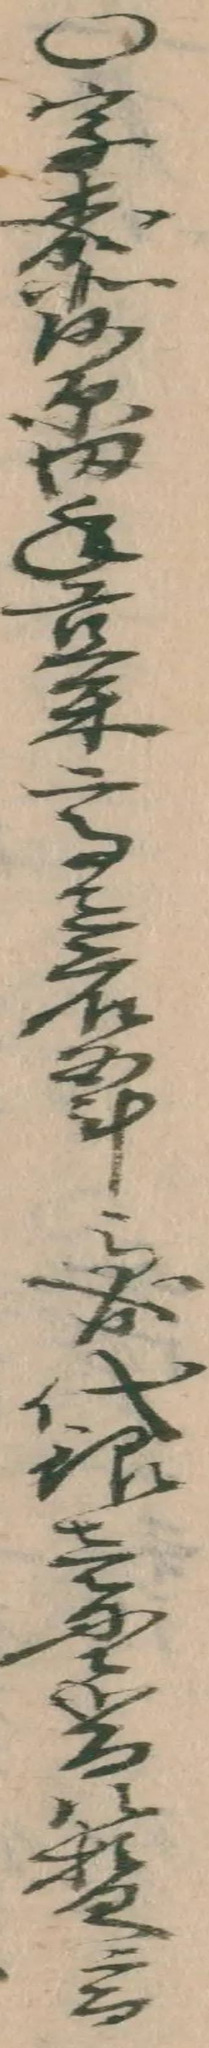○字森北河原田年貢米高一石五斗之成代銀壱貫弐百八拾匁ニ而
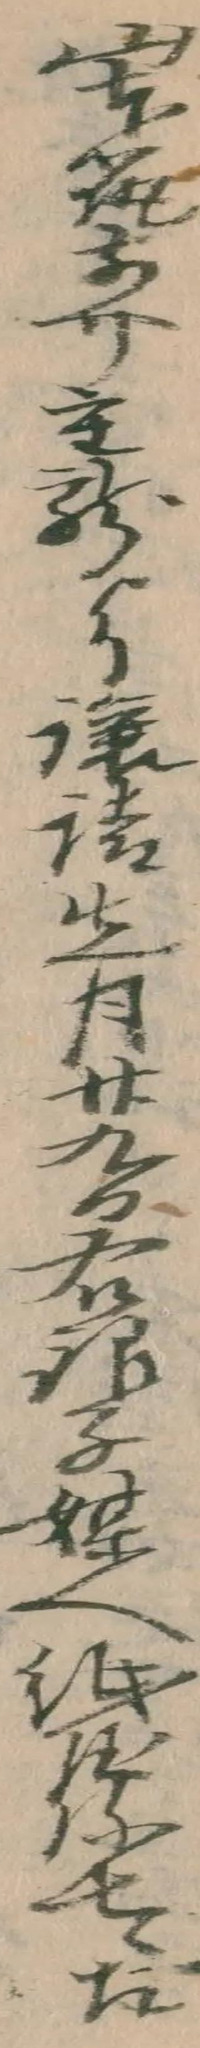山本筑前介重龍より譲請先月廿九日右銀子媒人紙屋弥七へ相
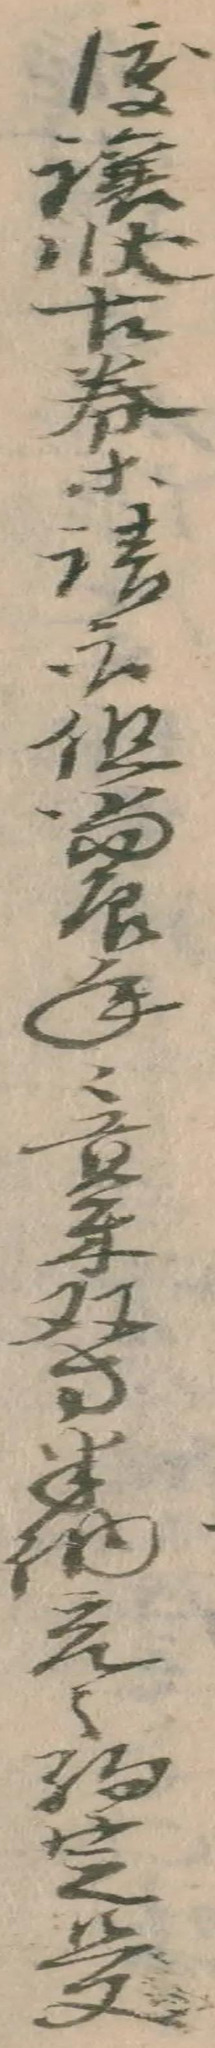渡譲状古券等請取但當辰年々貢米双方半納充之約定且又
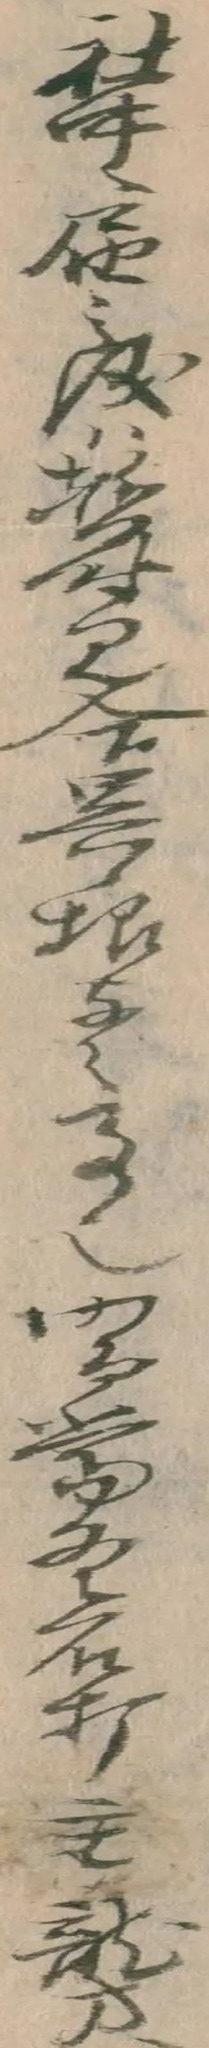社中ヘ届之儀ハ暫時見合呉候様与之事也仍而當冬石打重龍方へ
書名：賀茂社記録. 第69冊
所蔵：国立国会図書館 National Diet Library, JAPAN
